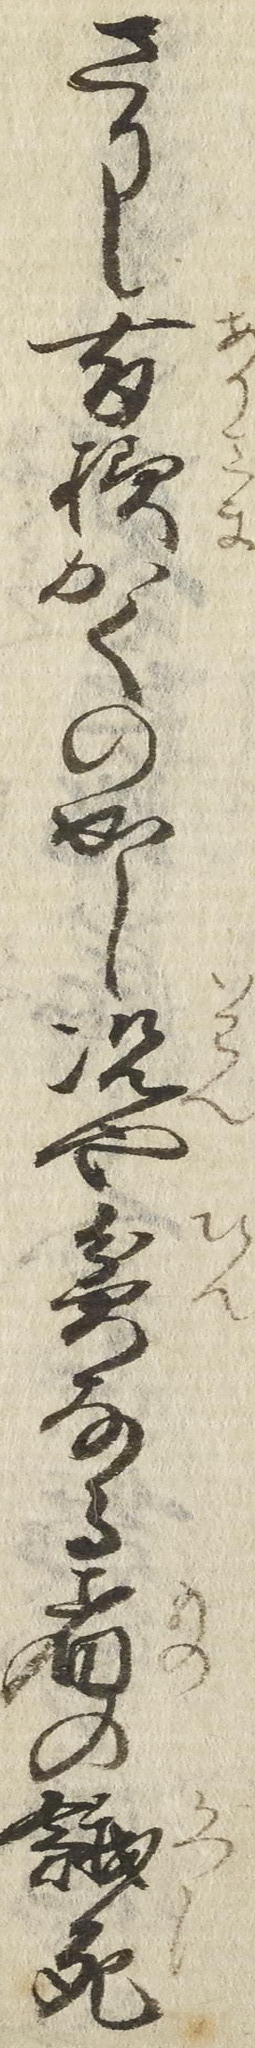さりし有様かくの如し況や貧なる者の餓死
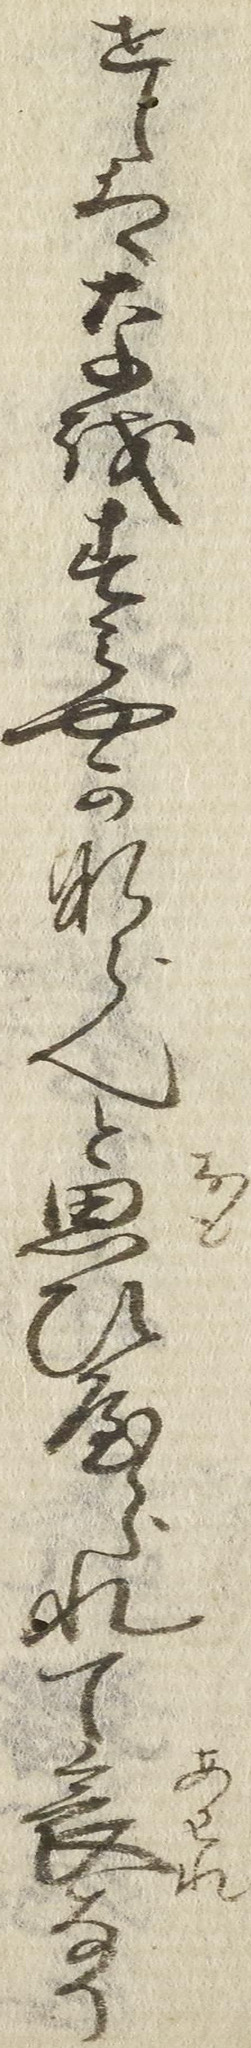せしはなをすみやかならんと思ひやられて哀なり
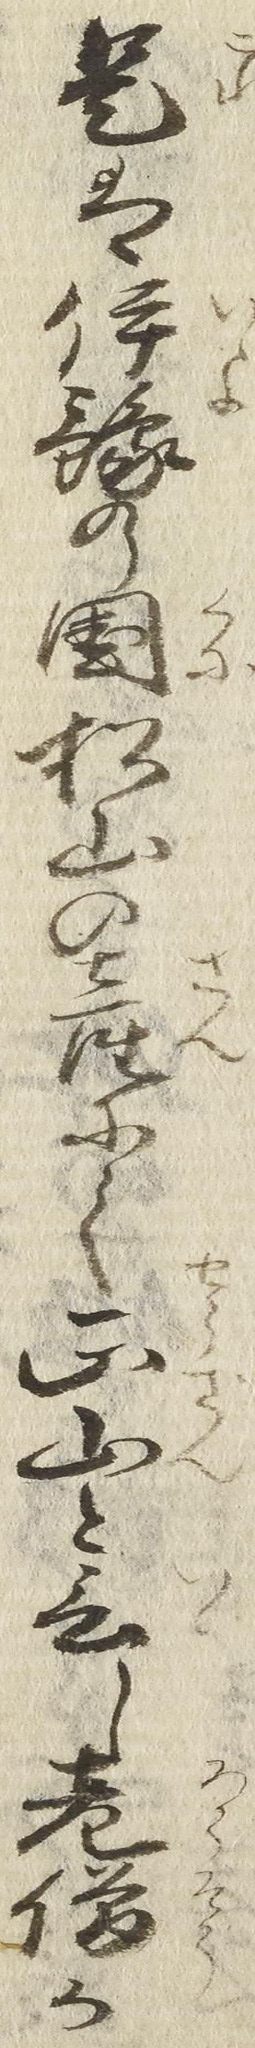是は伊豫の国松山の産にて正山と言し老僧か
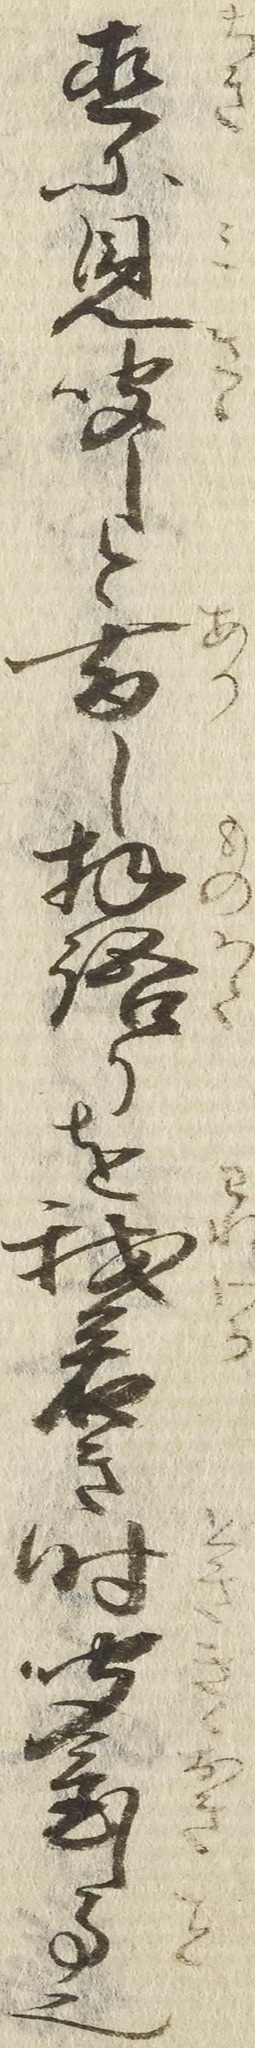直に見聞しと有し物語りを我若き時聞置事也
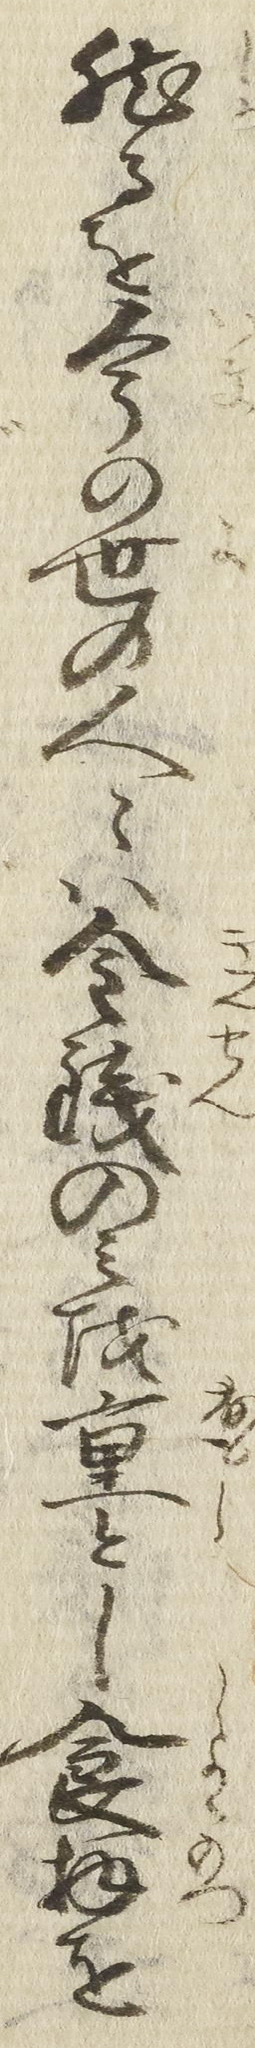然るを今の世の人〻は金銭のみを重とし食物を
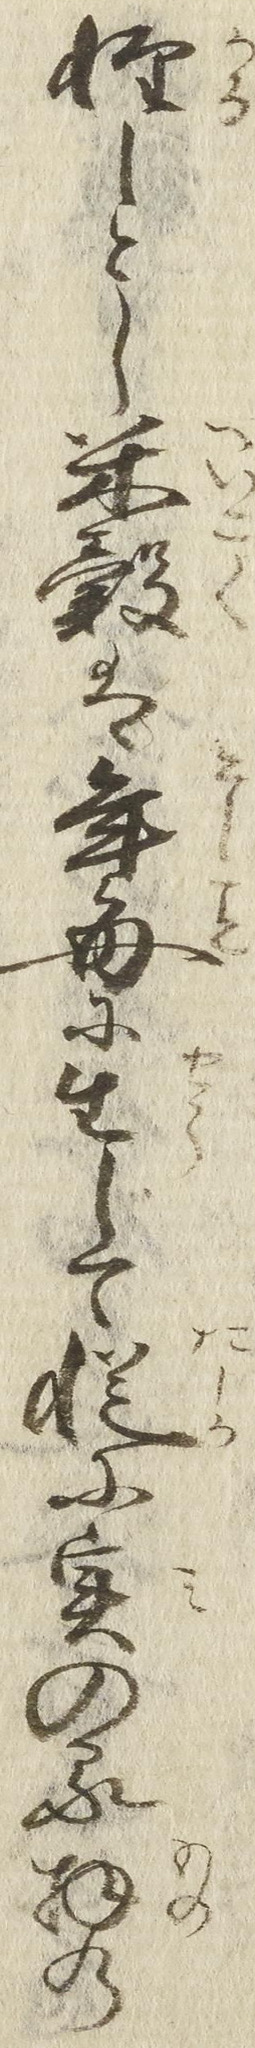軽しとし米穀は年毎に生じて慥に実のる物の
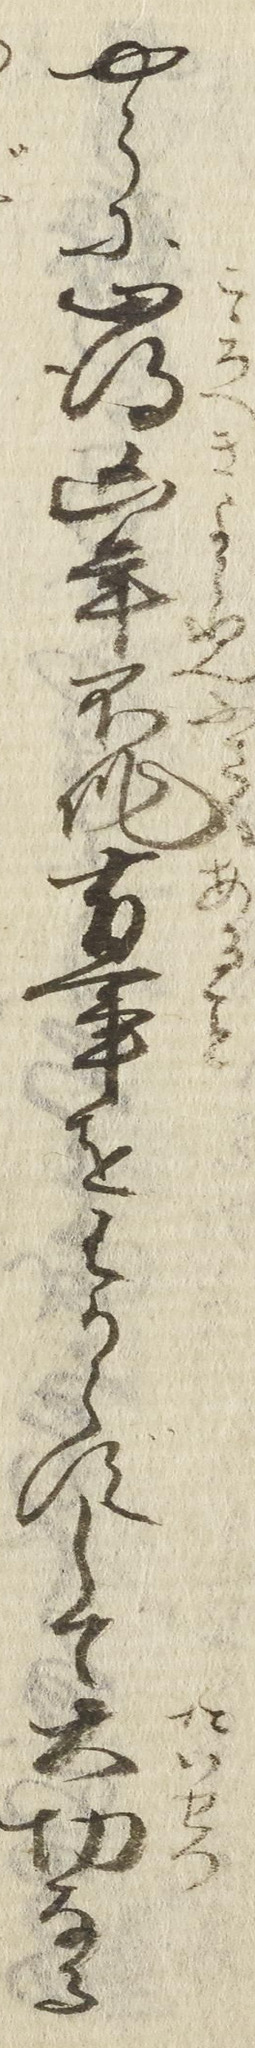やうに心得凶年不作有事をはからすして大切なる
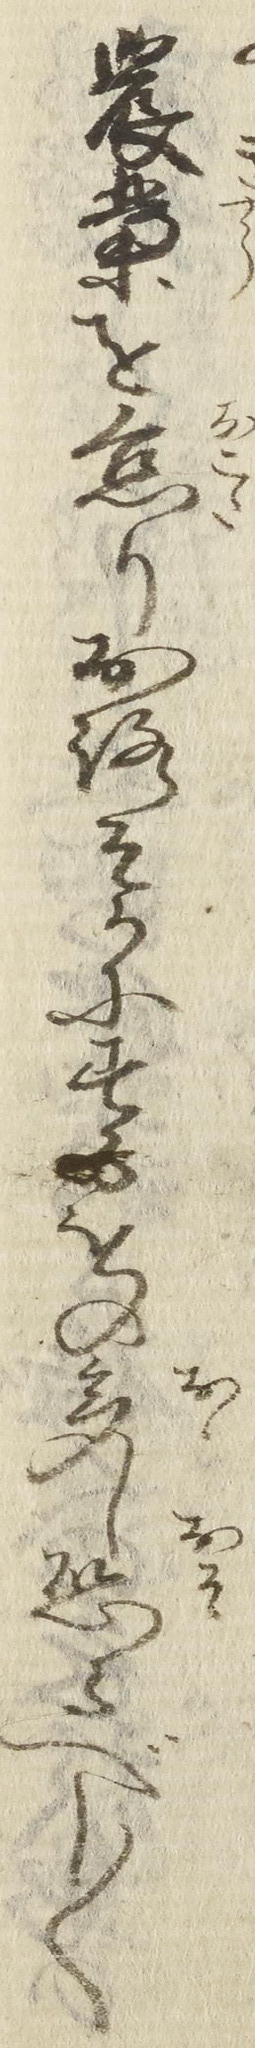農業を怠りおろそかにするもの多し恐るべし〳〵
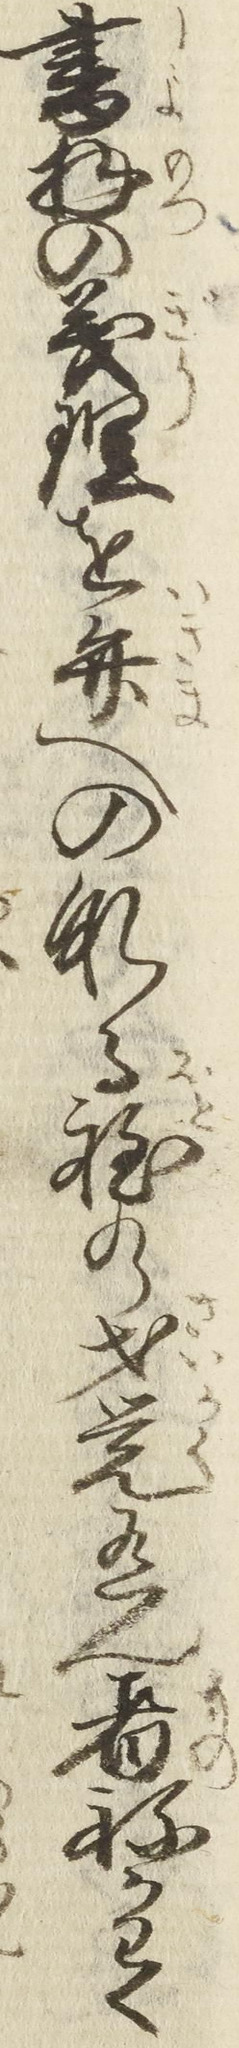書物の義理を弁へのれる程の才覚有ん者ねかわく
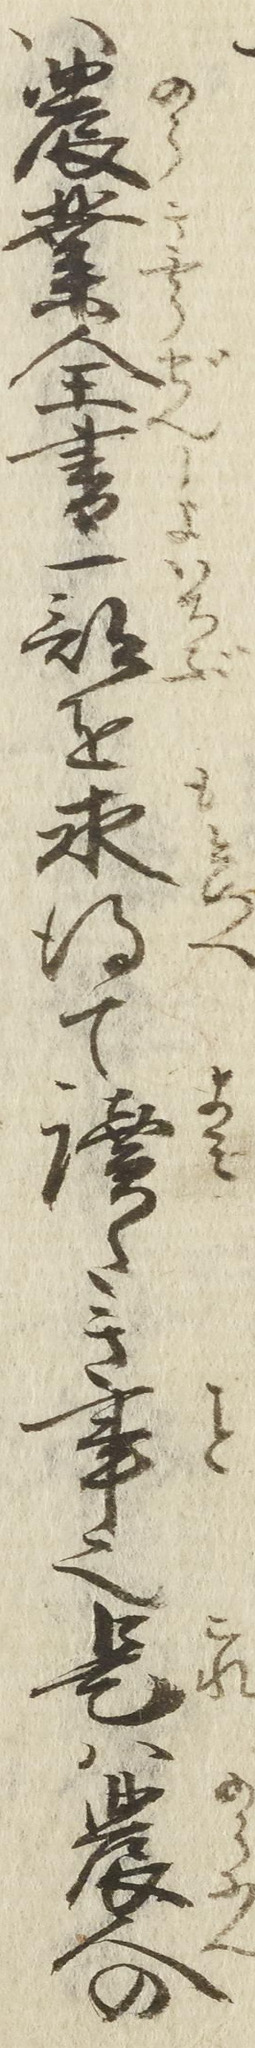は農業全書一部を求得て読たき事也是は農人の
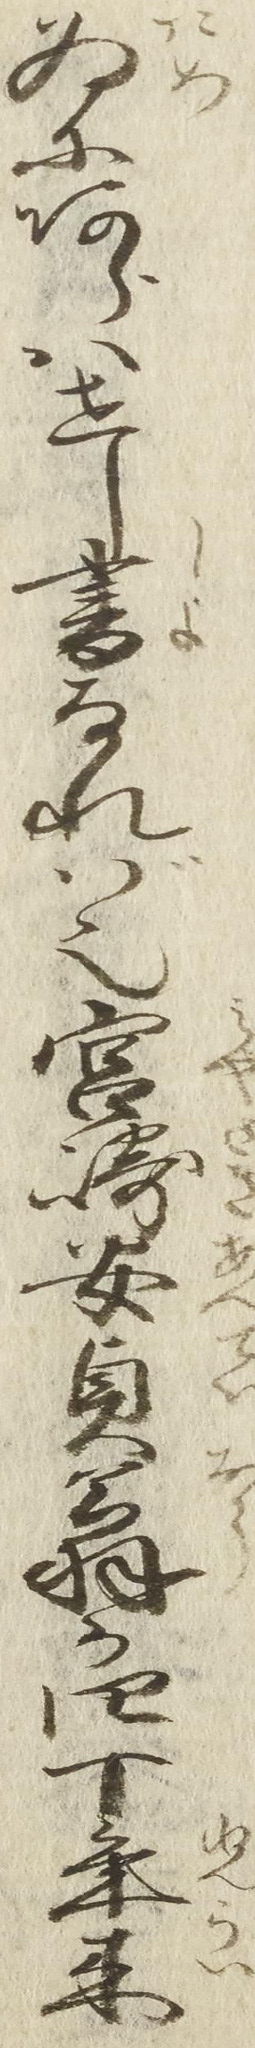為にあらはせし書なれば也宮崎安貞翁か四十年来
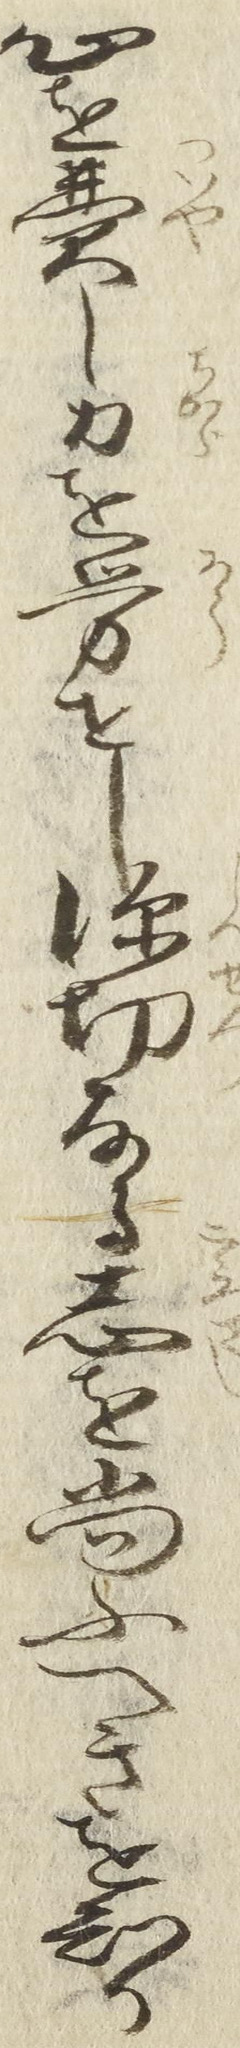心を費し力を労せし深切なる志を尚ふへきを知り
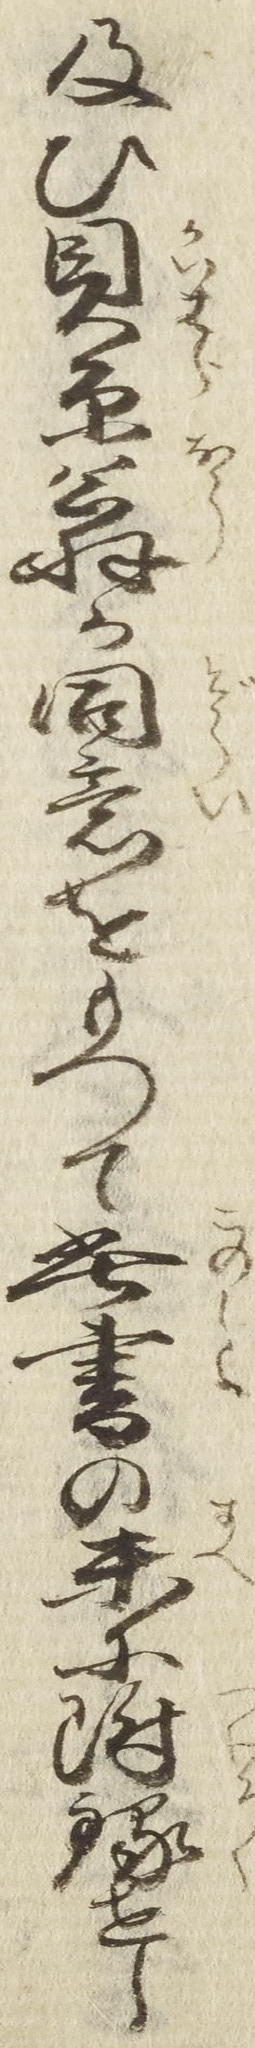及ひ貝原翁か同意をもつて此書の末に附録せし
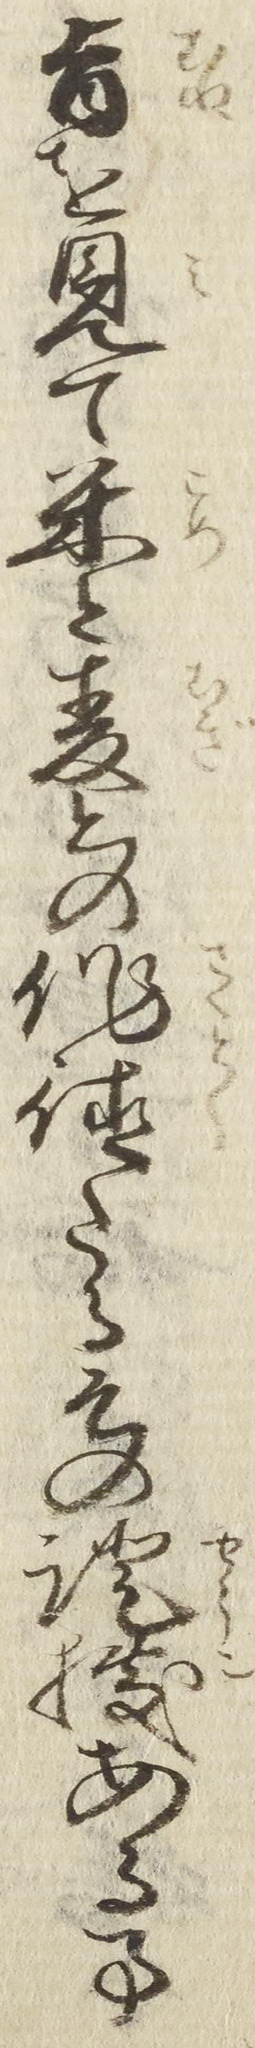旨を見て米と麦との作徳たるその證拠ある事
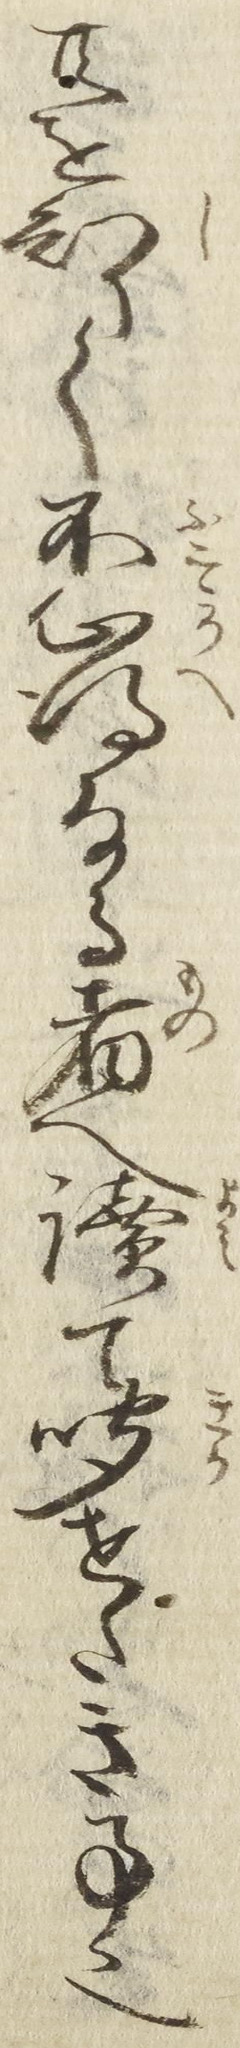共を知りて不心得なる者へ読て聞せたき事也
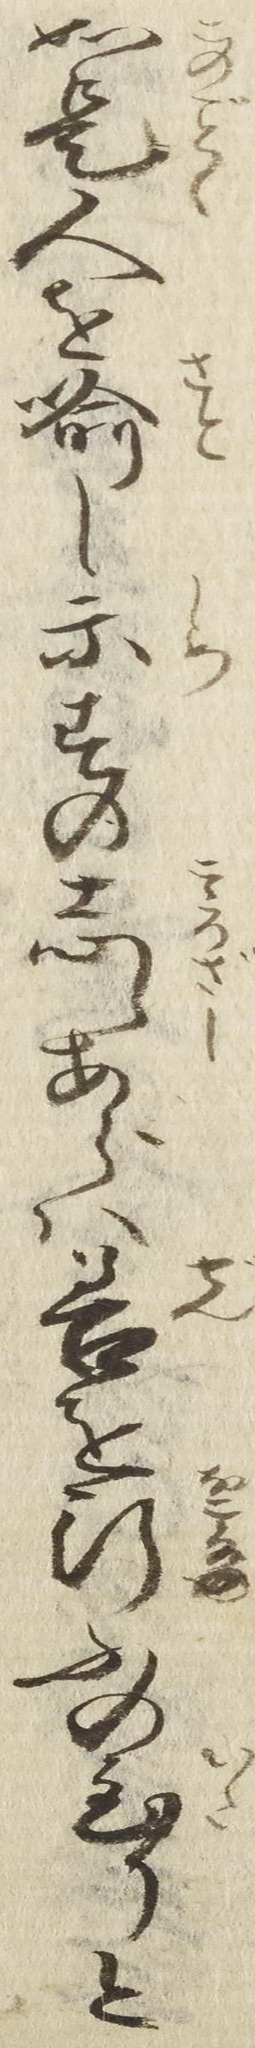如是人を諭し示すの志あらは善を行ふの至りと
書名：天明奇畧　全
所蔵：東京大学地震研究所図書室 Earthquake Research Institute Library, The University of Tokyo, JAPAN
